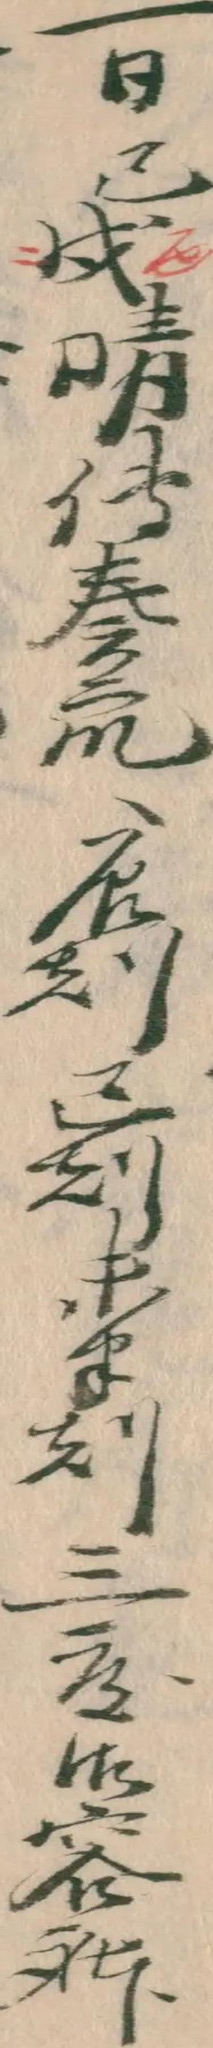三日己戌晴傳奏衆へ辰刻巳刻未半刻三度御容躰
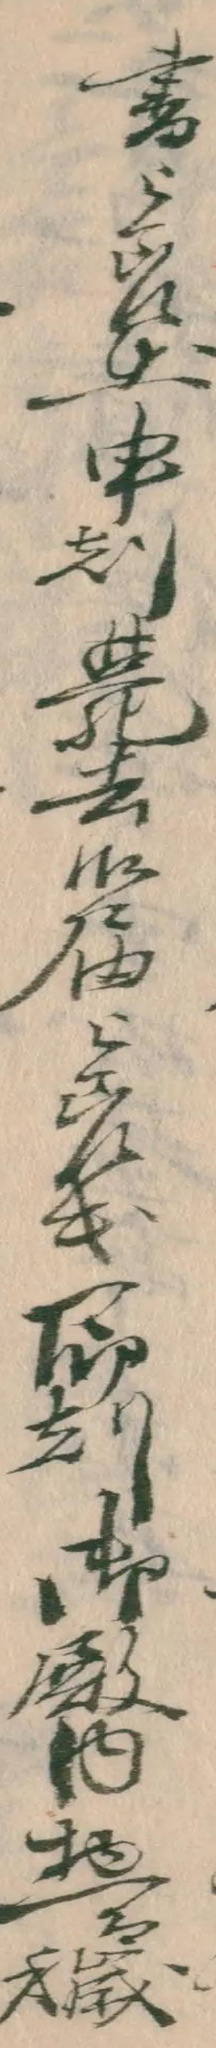書被差出申刻薨去御届被差出即刻御殿内惣而穢
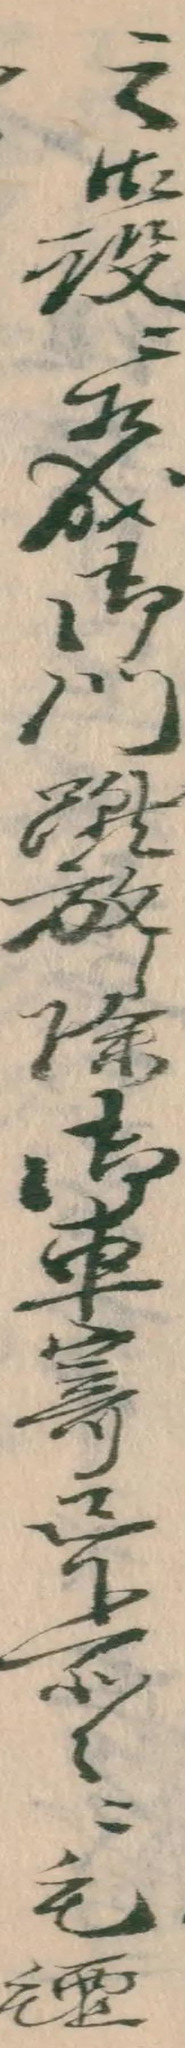之御設ニ相成御門蹴放し除御車寄已下所々二毛氈
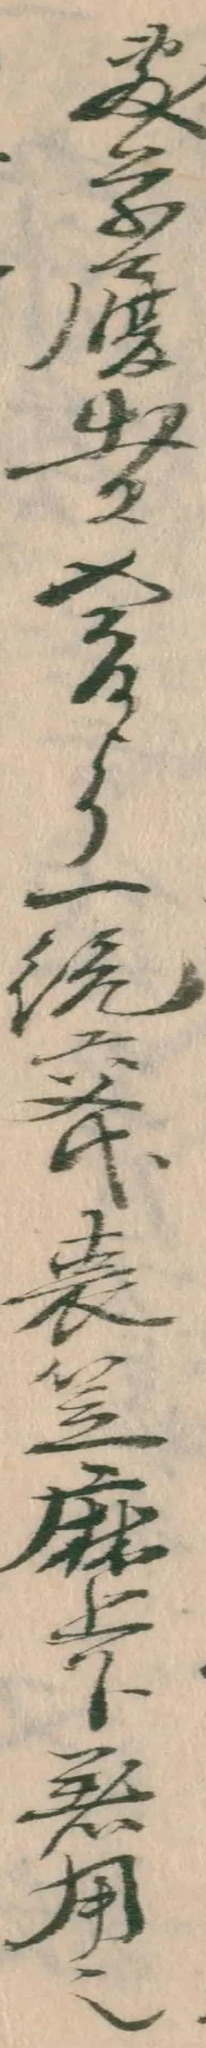敷草履出候今日より一統交替喪笠麻上下着用也
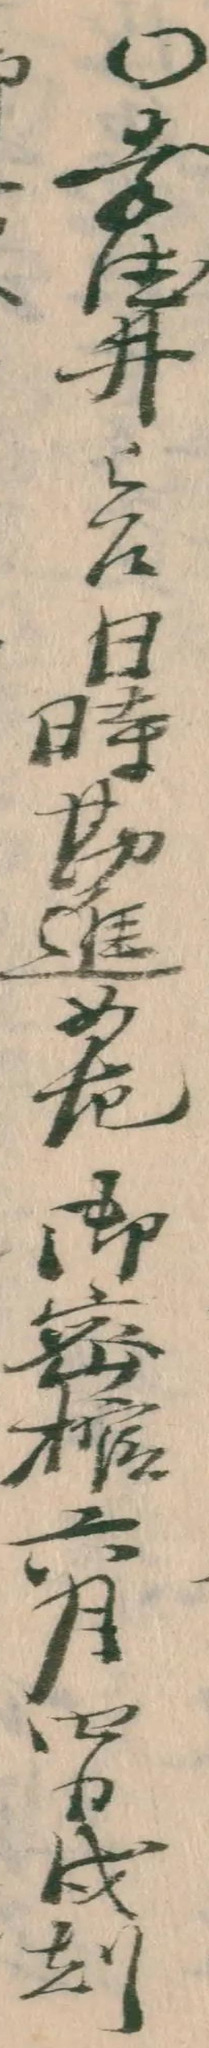○幸徳井被召日時切進如左御密棺六月四日戌刻
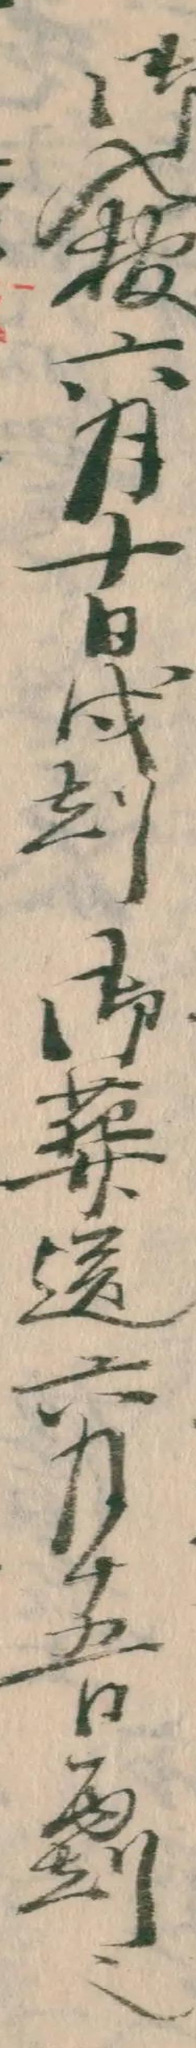御入棺六月十日戌刻御葬送六月十五日酉刻也
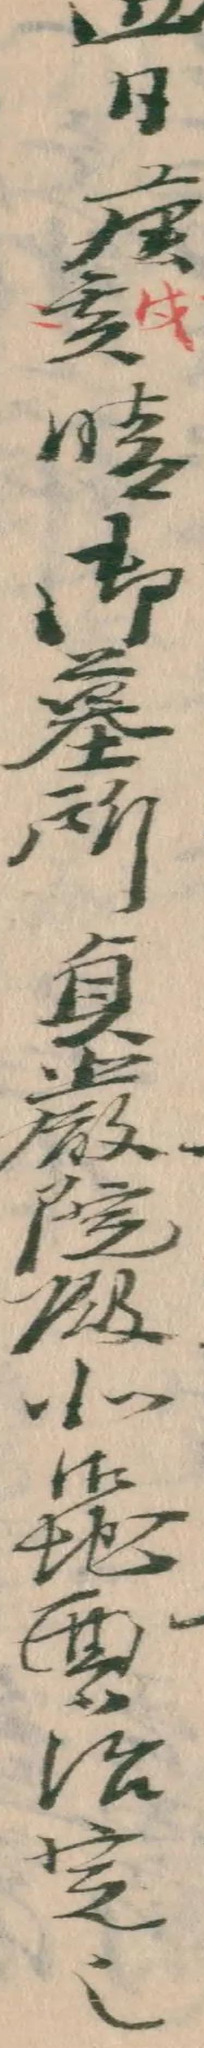四日庚亥晴御墓所貞厳院殿北御地面御治定也
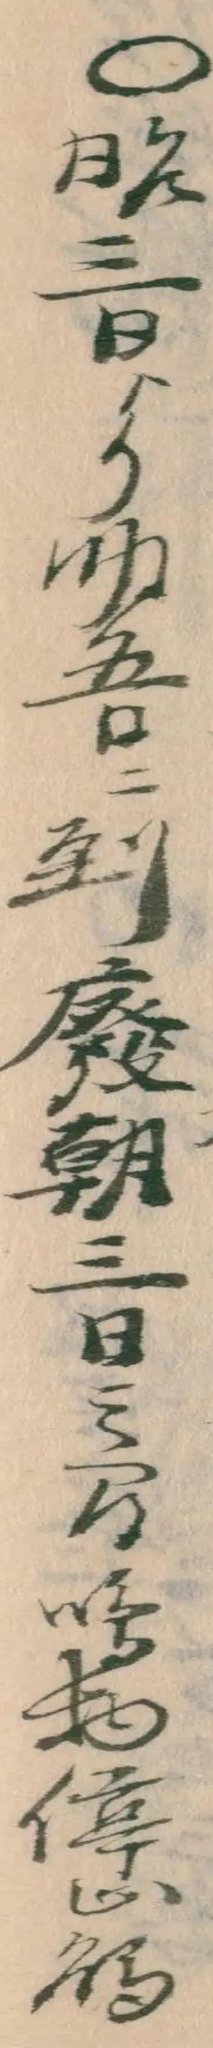○昨三日より明五日ニ到廢朝三日之間鳴物停止觸
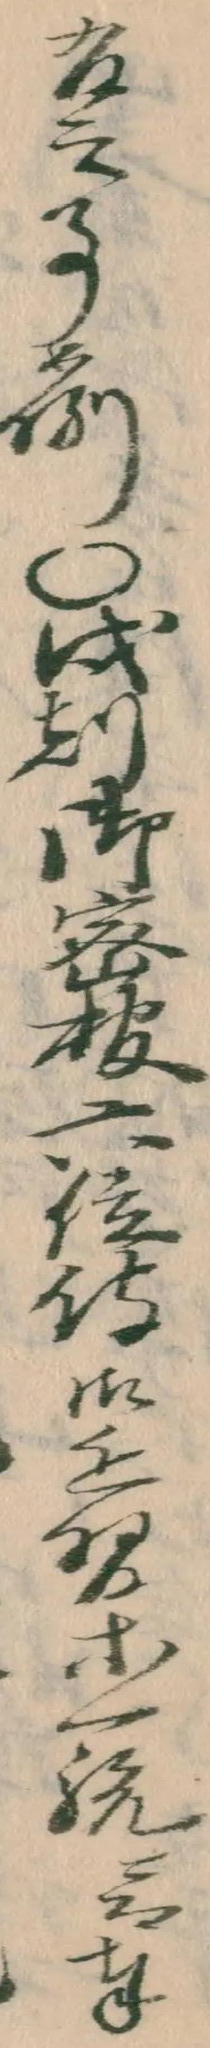有之事如例○戌刻御密棺六位侍御近習等一統ニ而奉
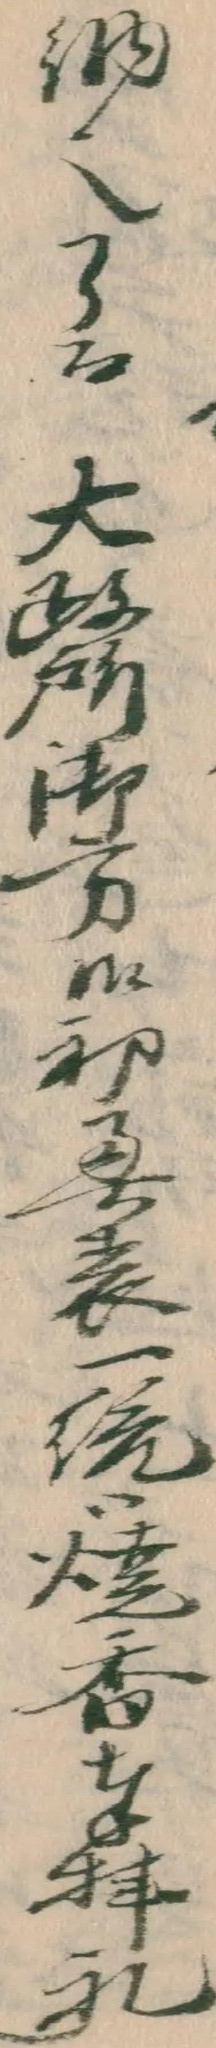納之了而大政所御方御初奥表一統御焼香奉拝礼
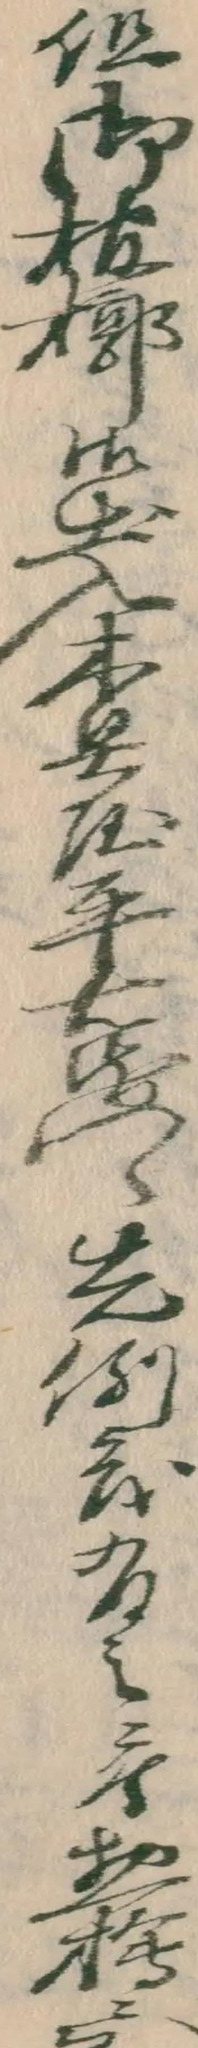但御棺榔御出入木具屋平右衛門先例も有之ニ付惣檜ニ而
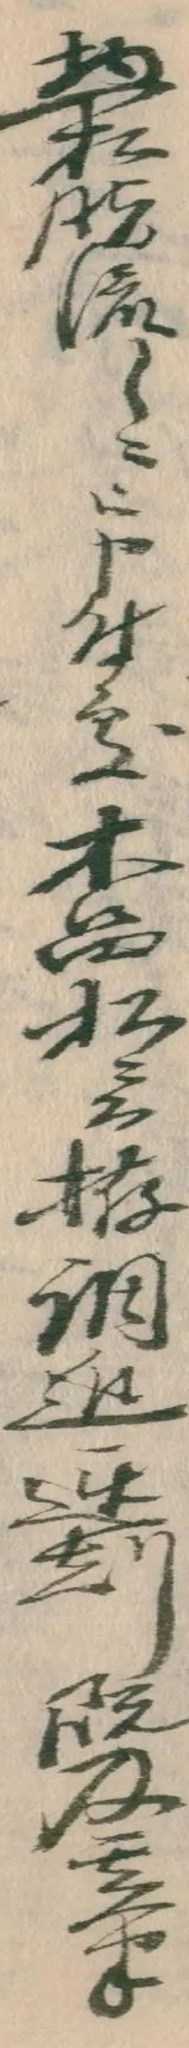惣松脂流しニ被申付處木品松ニ而拵調進遅刻既及亥半
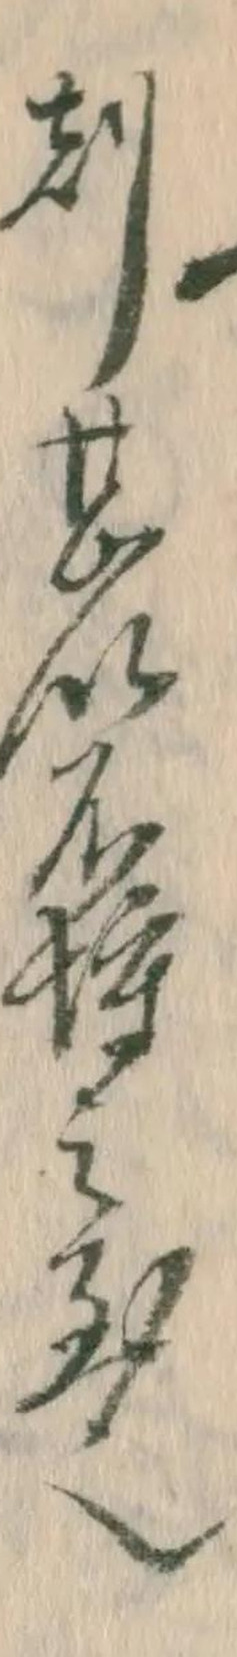刻甚以不埒之至也
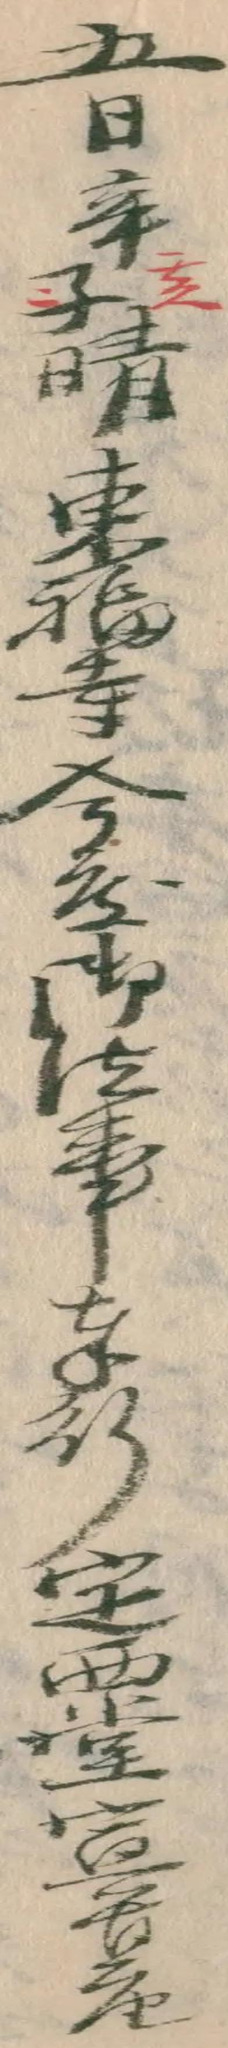五日辛未晴東福寺今度御法事奉行定西堂宣首座
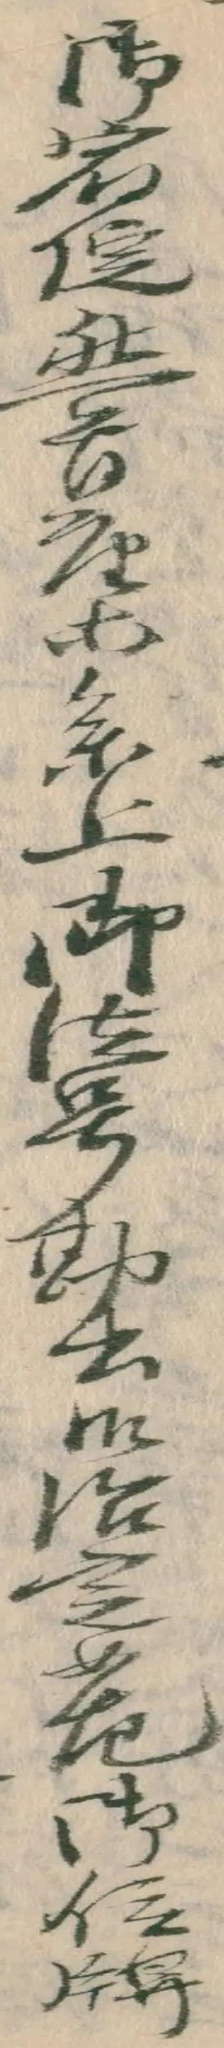御宿位然首座等参上御法号勘書御治定如左御位牌
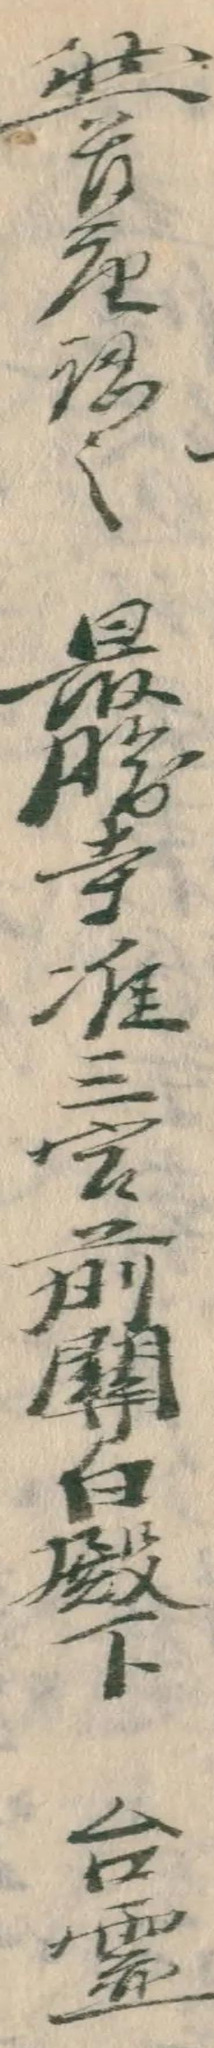然首座認之最勝寺准三宮前関白殿下台霊
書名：賀茂社記録. 第67冊
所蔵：国立国会図書館 National Diet Library, JAPAN
